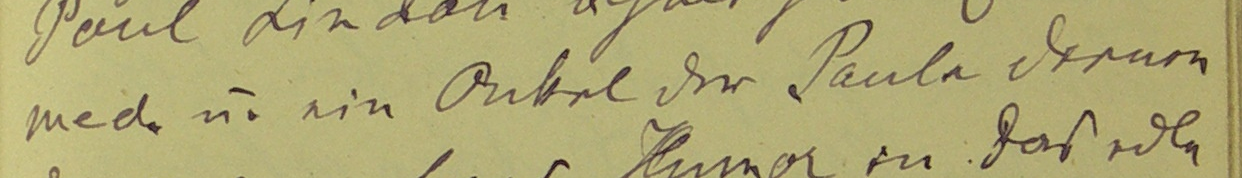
med. und ein Onkel der Paula dienen
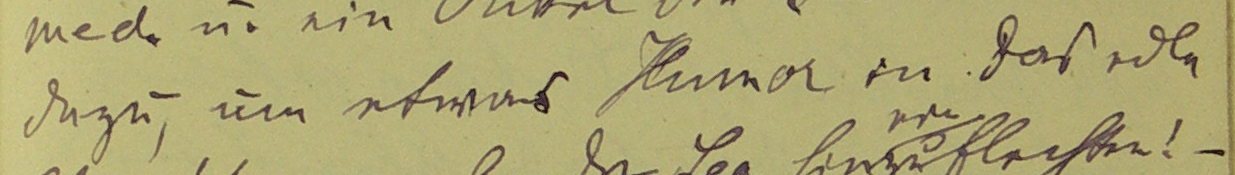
dazu, um etwas Humor in das edle
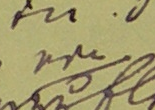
von
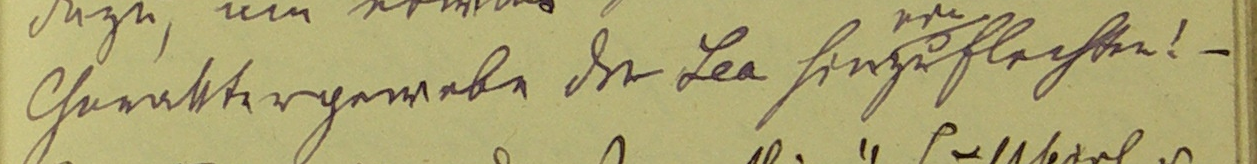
Charaktergewebe de Lea hineinzu flechten!.—
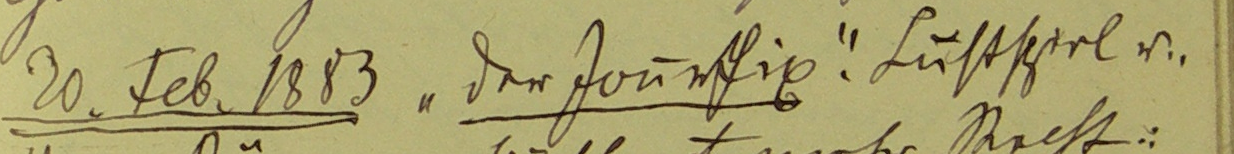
20. Februar 1883 „ Der Jourtip“…Lustspiel von
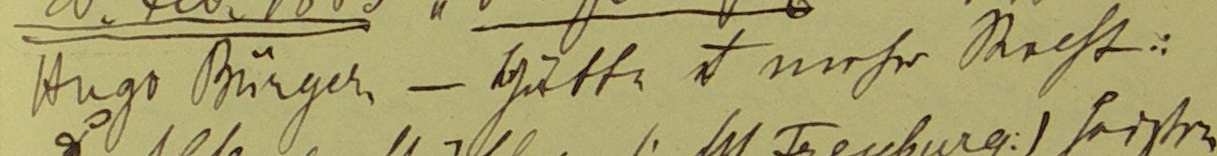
Huge Bürger - Hätte mit mehr Recht
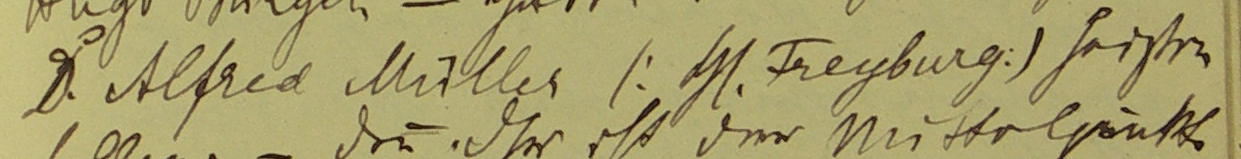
D. Alfred Müller (: H. Freyburg: ), heißen
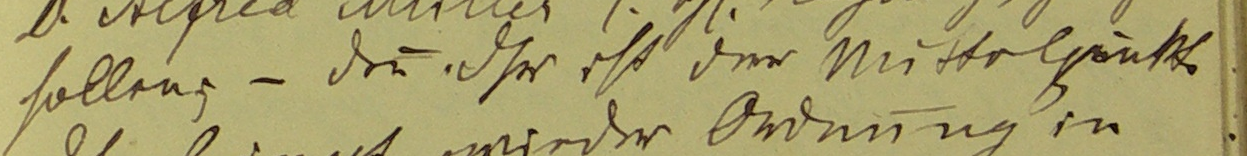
sollen. Den dieser ist der Mittelpunkt.
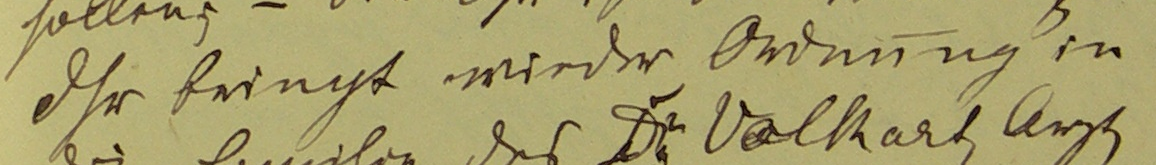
Dieser bringt wieder Ordnung in
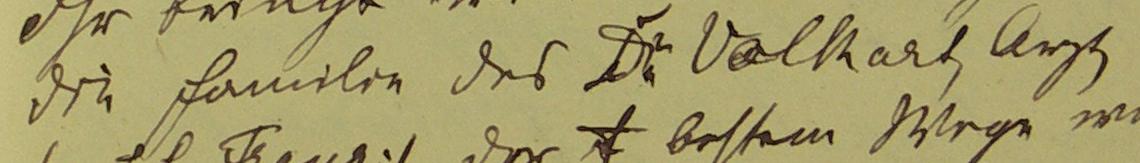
die Familie des Dr. Volkart, Arzt
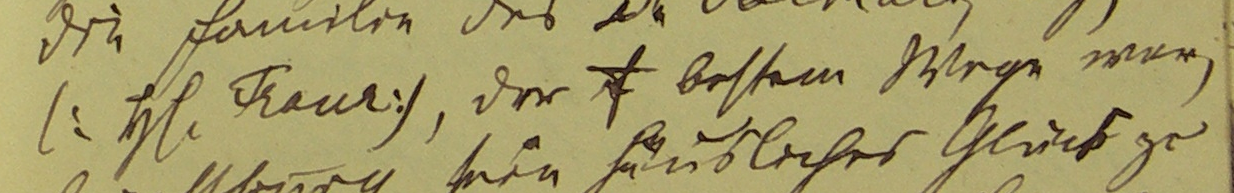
(: H. Franz. ) der auf bestem Weg war
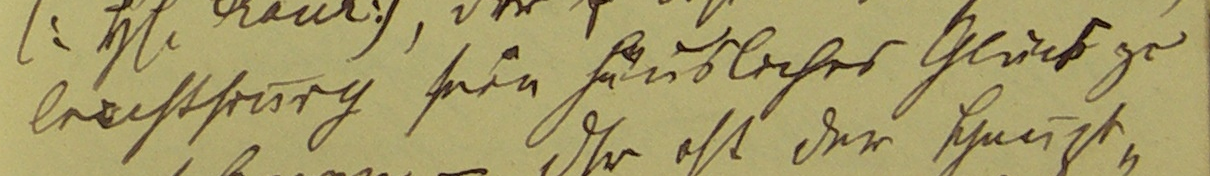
leichtsinnig sein häusliches Glück zu
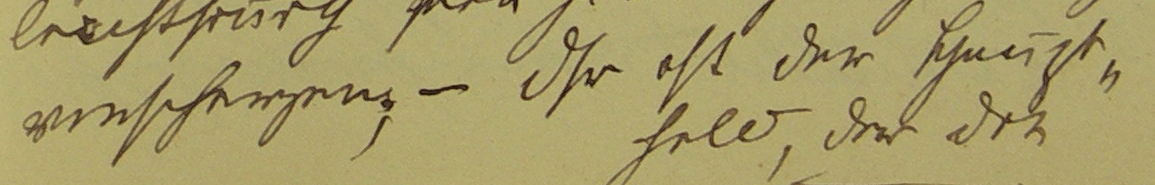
verscherzen,- dies ist der Haupt¬
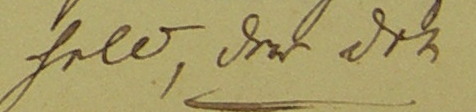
held, der dies
